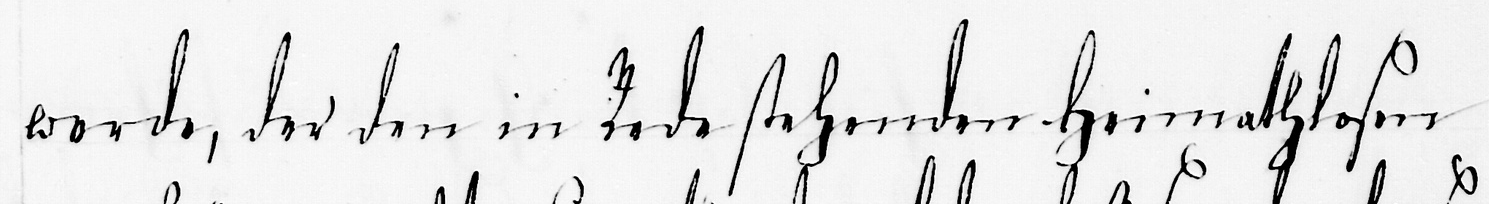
werde, der den in Rede stehenden Heimathlosen
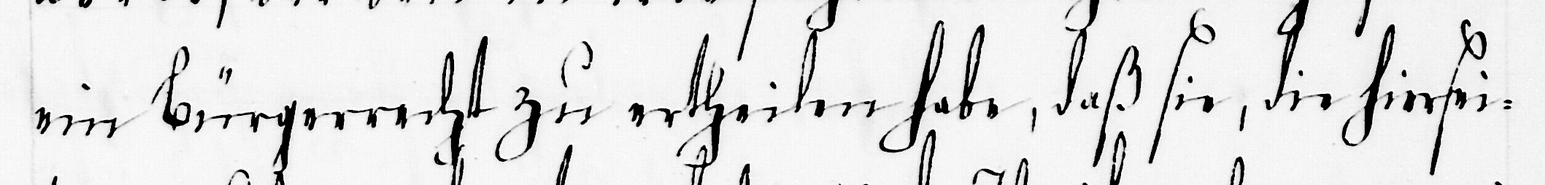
ein Bürgerrecht zu ertheilen habe, daß sie, die hierse¬
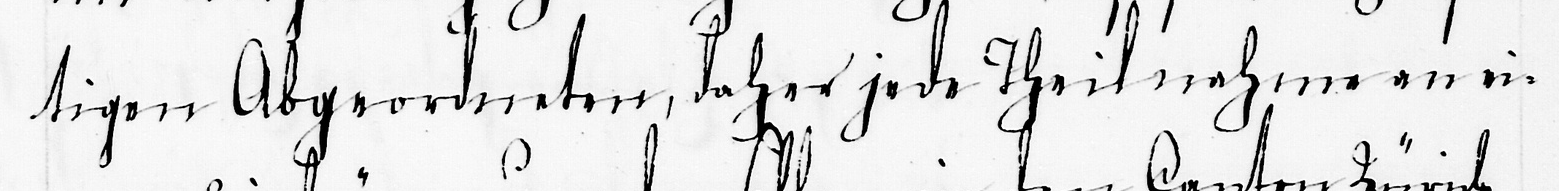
itigen Abgeordneten, daher jede Theilnahme an ei¬
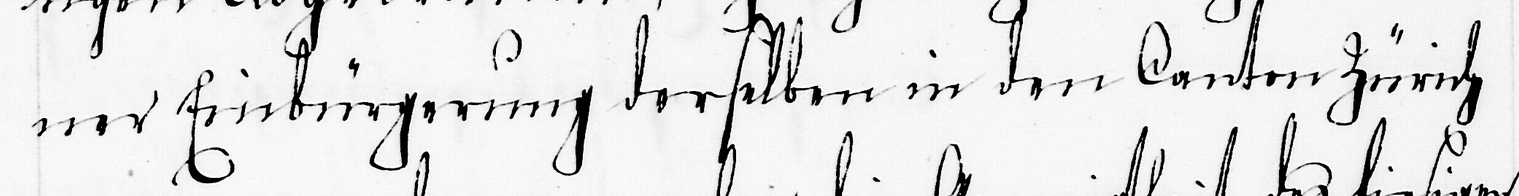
ner Einbürgerung derselben in den Canton Zürich
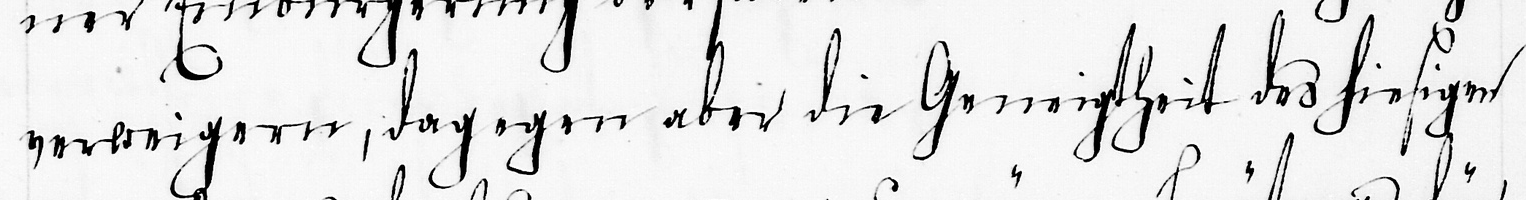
verweigern, dagegen aber die Geneigtheit des hiesigen
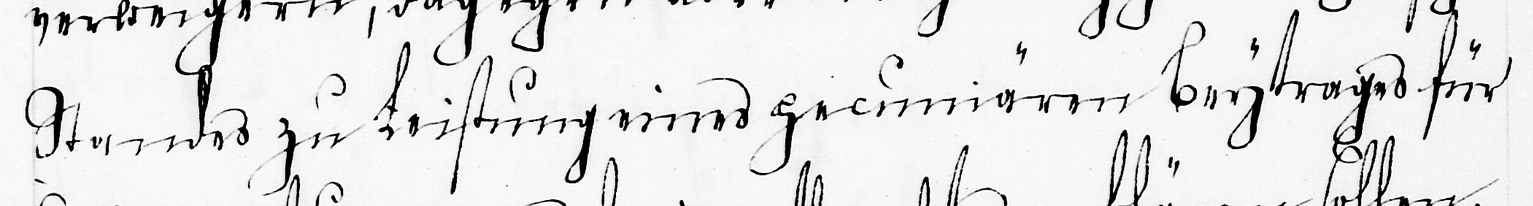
Standes zu Leistung eines pecuniären Beytrages für
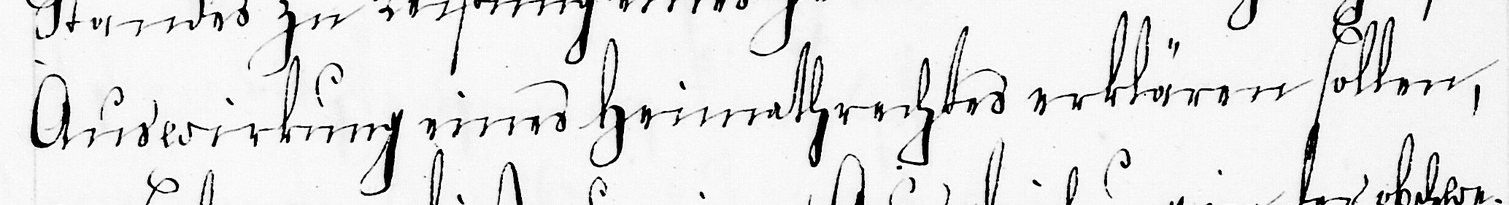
Auswirkung eines Heimathrechtes erklären sollen,
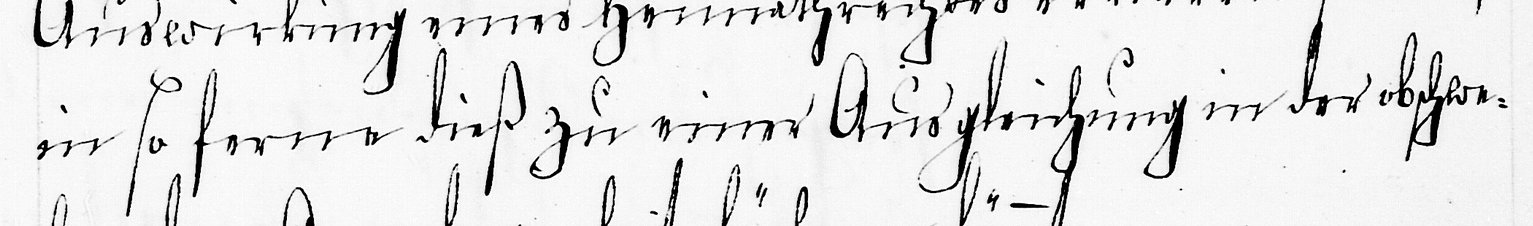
in so ferne dieß zu einer Ausgleichung in der obschwe¬
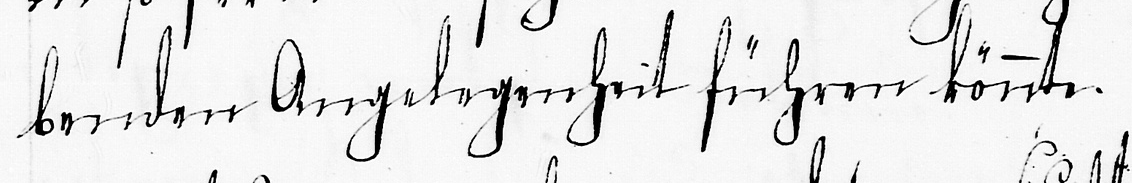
benden Angelegenheit führen könnte.
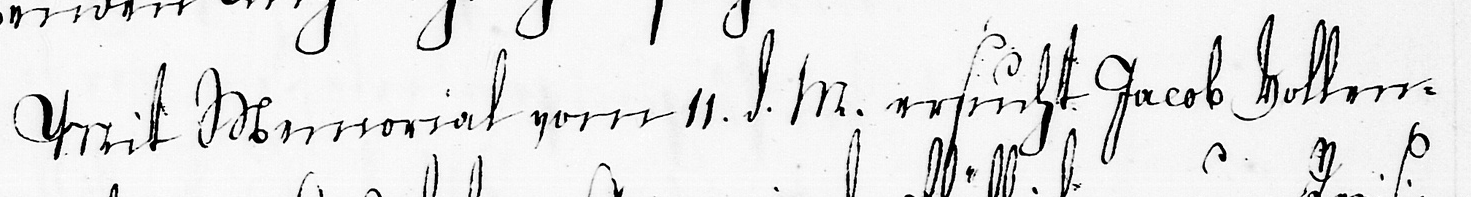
Mit Memorial vom 11. d. M. ersucht Jacob Vollen¬
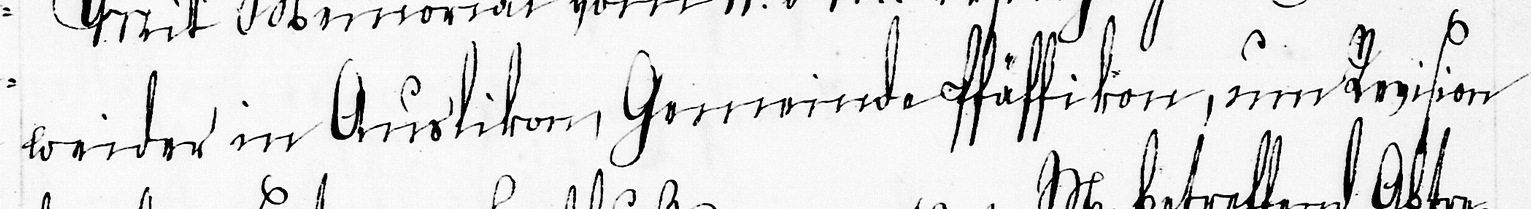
weider in Auslikon, Gemeinde Pfäffikon, um Revision
